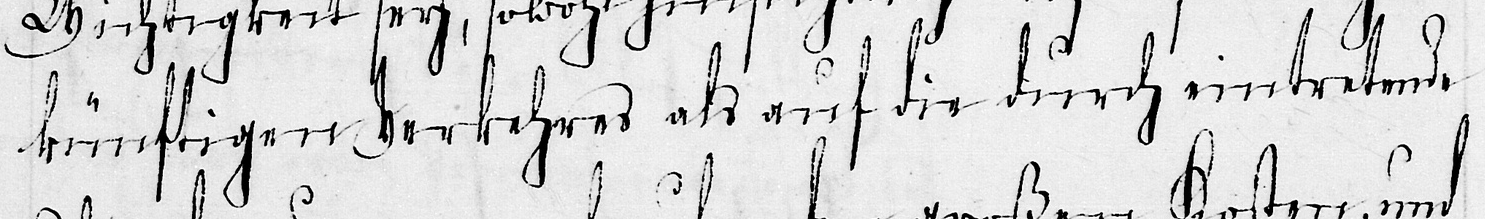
künftigen Verkehres als auf die durch eintretende
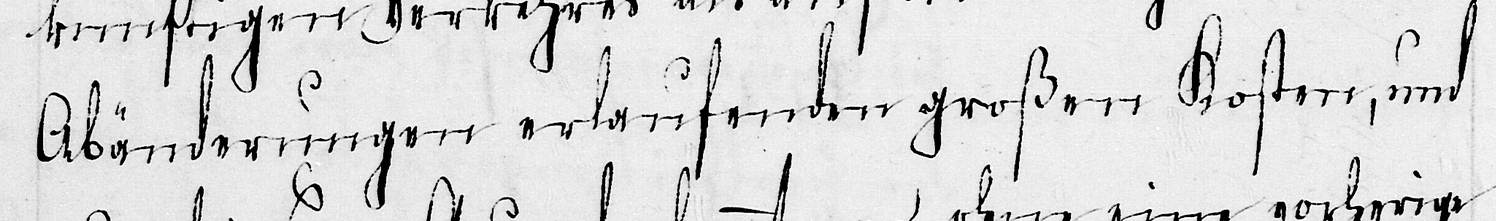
Abänderungen erlaufenden großen Kosten, und
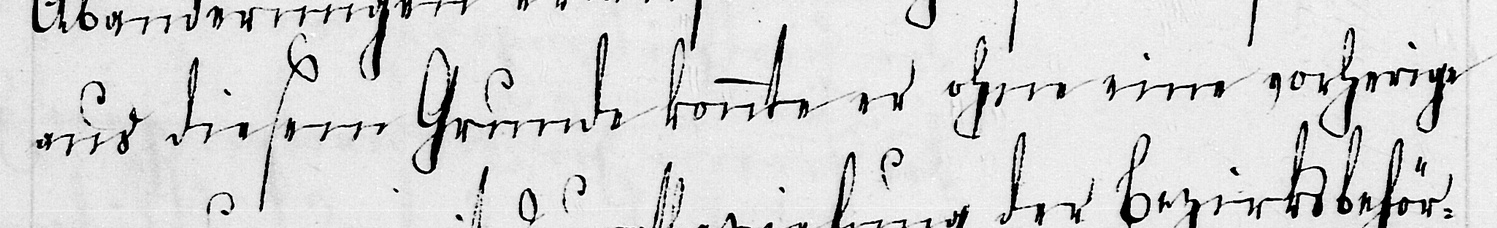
aus diesem Grunde konnte er ohne eine vorherige
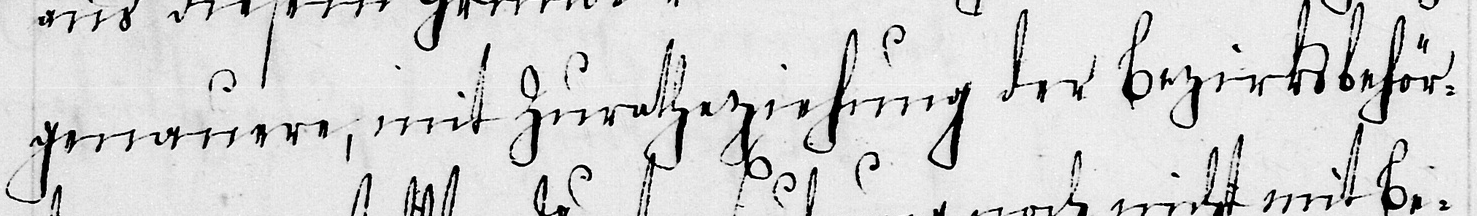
genauere, mit Zuratheziehung der Bezirksbehör¬
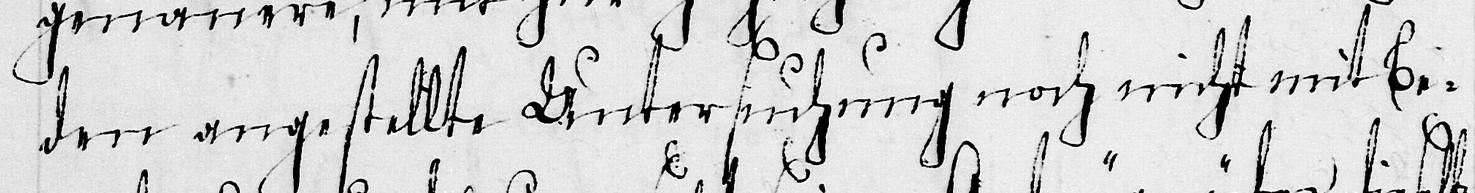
den angestellte Untersuchung noch nicht mit Be¬
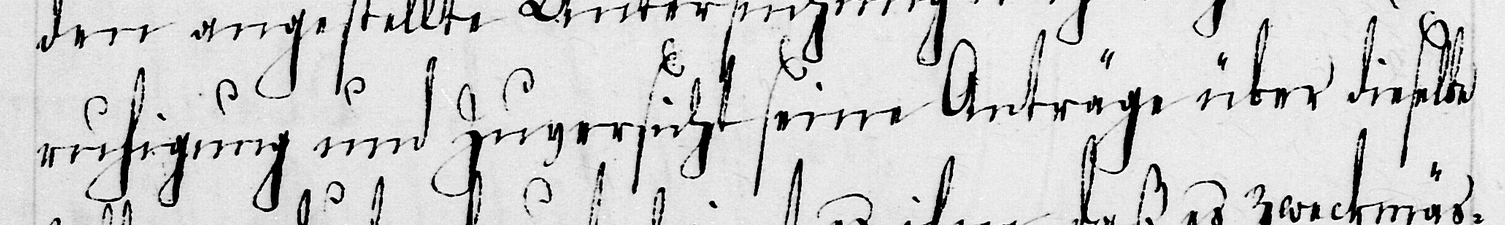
ruhigung und Zuversicht seine Anträge über dieselbe
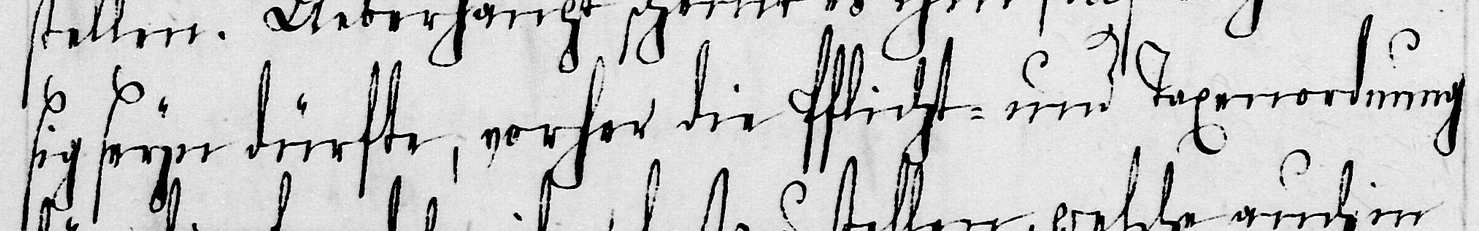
ig seyn dürfte, vorher die Pflicht- und Taxenordnung
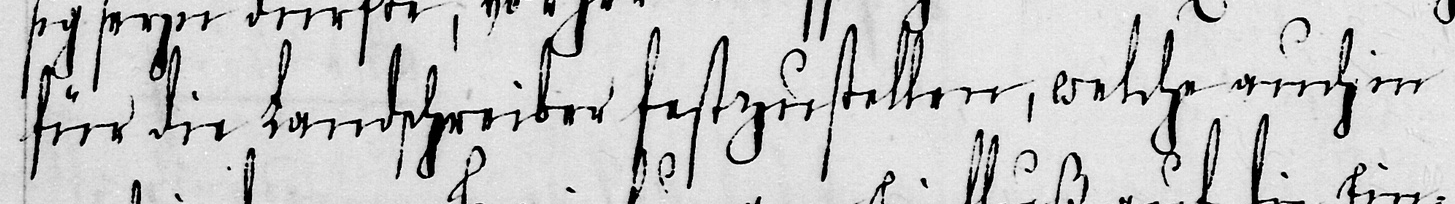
für die Landschreiber festzustellen, welche auch in
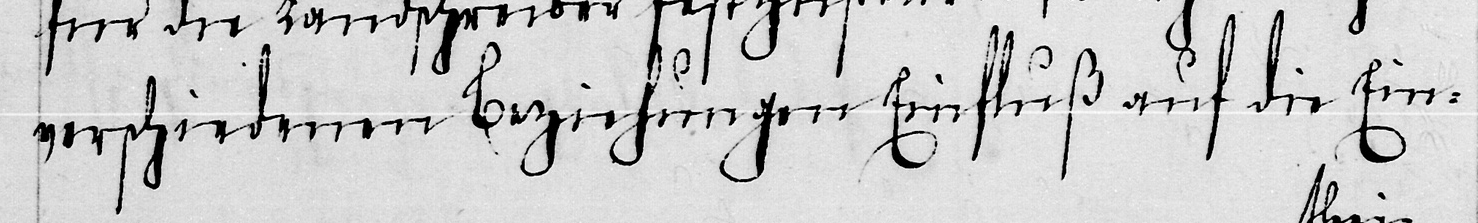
verschiedenen Beziehungen Einfluß auf die Ein-
